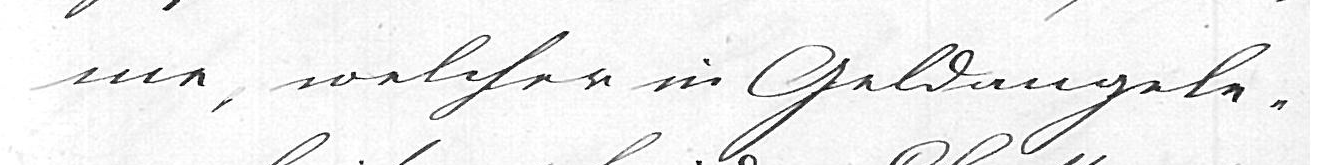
me, welcher in Geldangele-
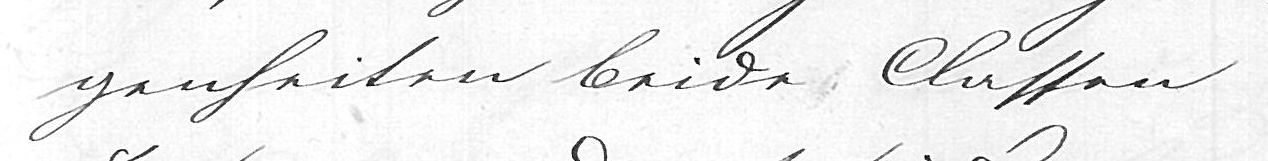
genheiten beide Classen
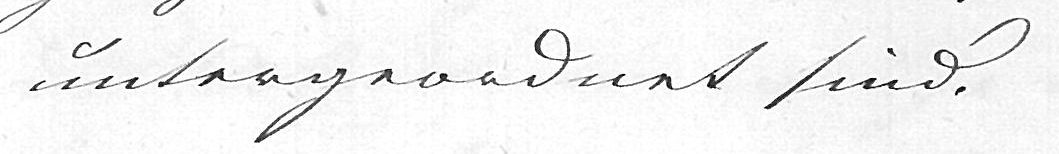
untergeordnet sind.
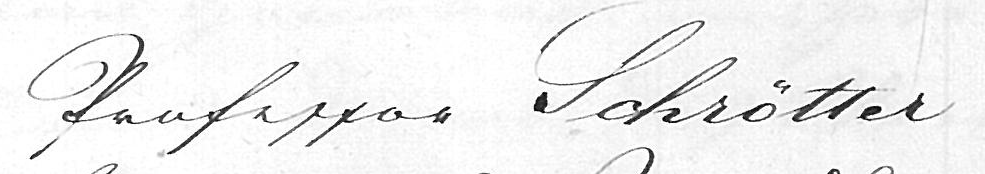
Professor Schrötter
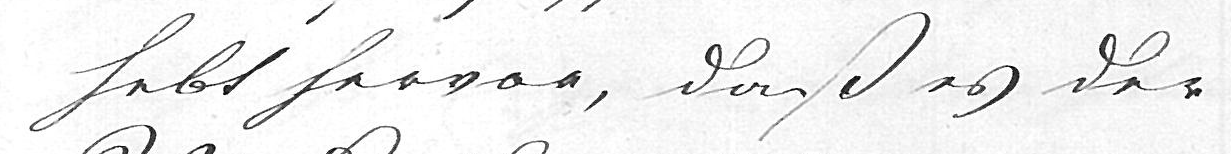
hebt hervor, daß es der
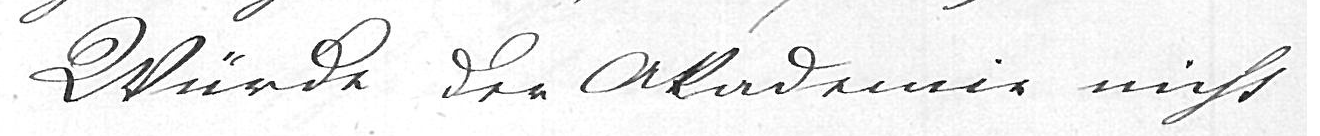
Würde der Akademie nicht
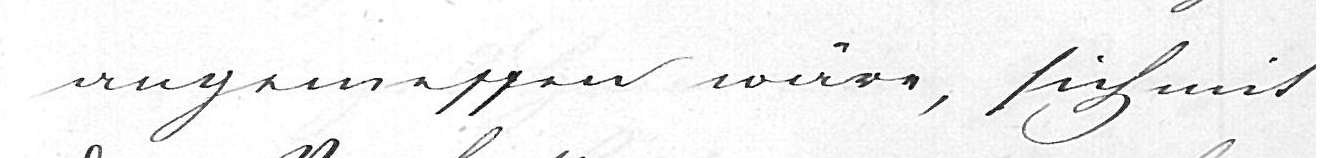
angemessen wäre, sich mit
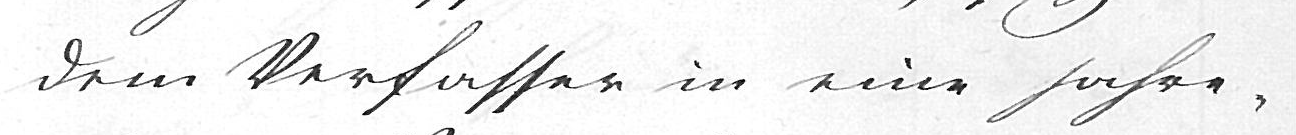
dem Verfasser in eine jahre-
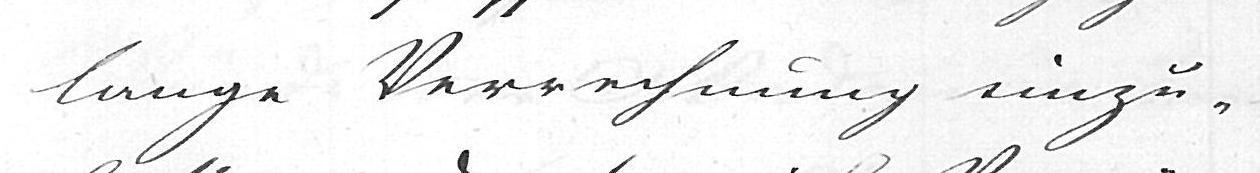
lange Verrechnung einzu-
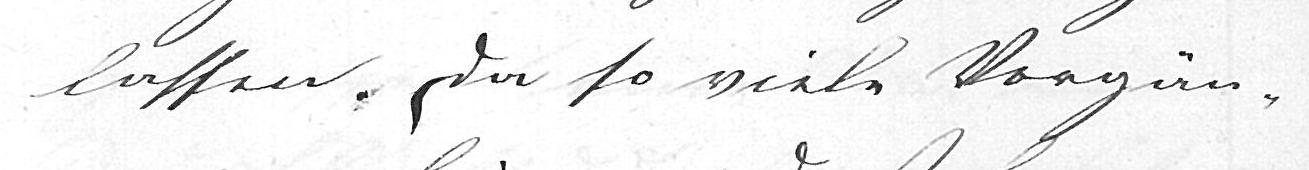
lassen. Da so viele Vorgäng-
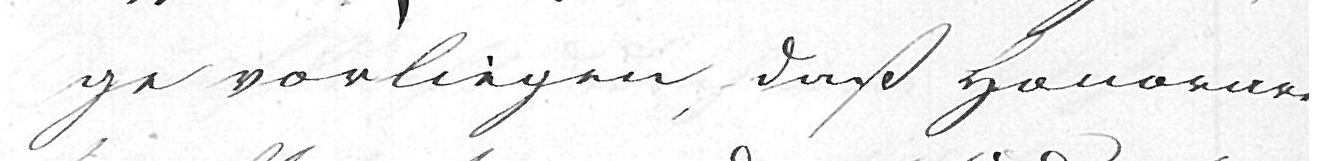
ge vorliegen, daß Honorare
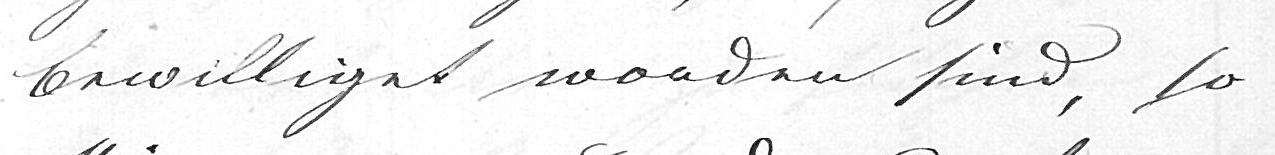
bewilliget worden sind, so
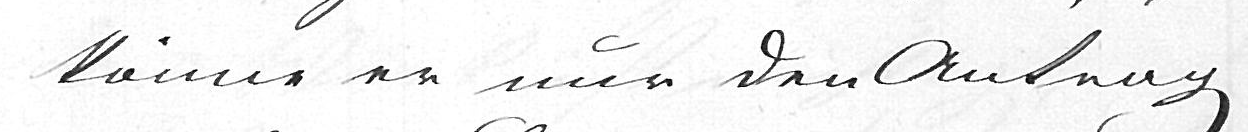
könne er nur den Antrag
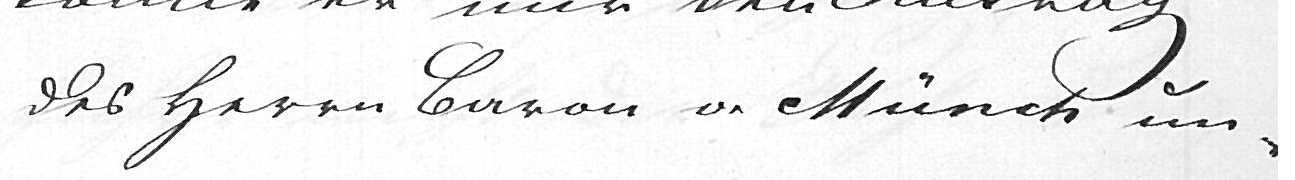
des Herrn Baron v. Münch un-
